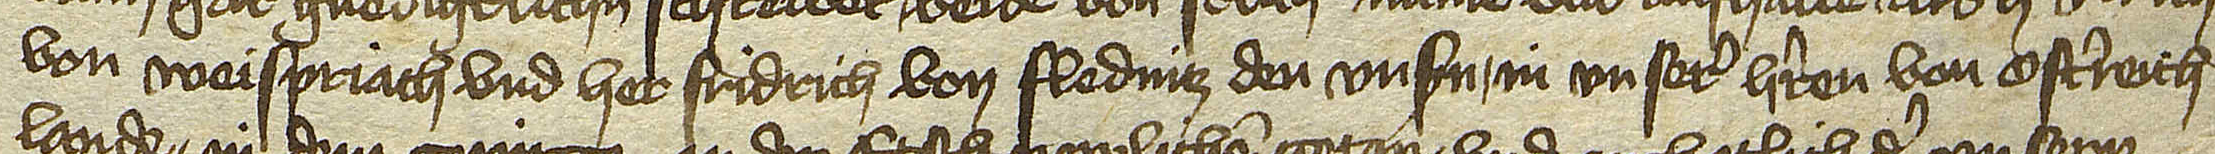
von weiſpriach vnd her fridrich von flednicʒ den vnſ*n / in vnſer* h*ren von Ost*reich
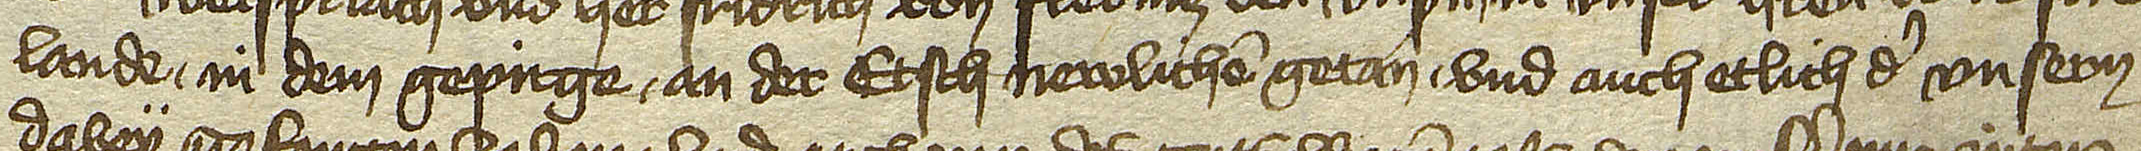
lande / in dem gepirge / an der Etſch newliche* getan / vnd auch etlich d* vnſern
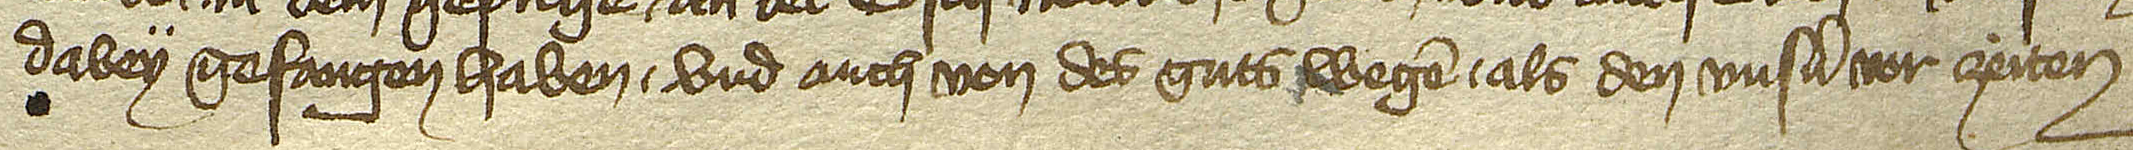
dabey gefangen haben / vnd auch von des guts wege* / als den vnſn* cʒeiten
